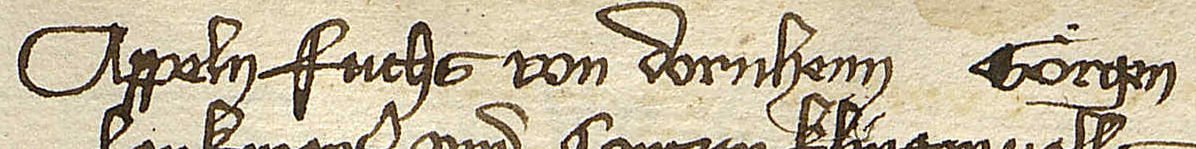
Appeln Fuchs von Dornheim Görgen
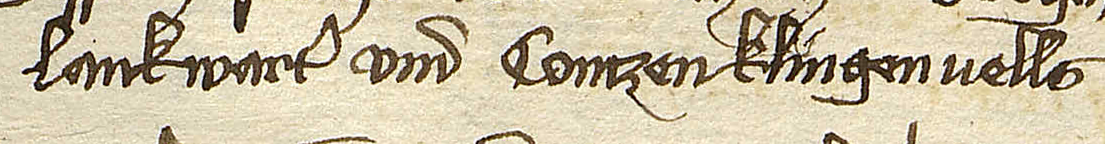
lankwart* vnd Concʒen klingenuells
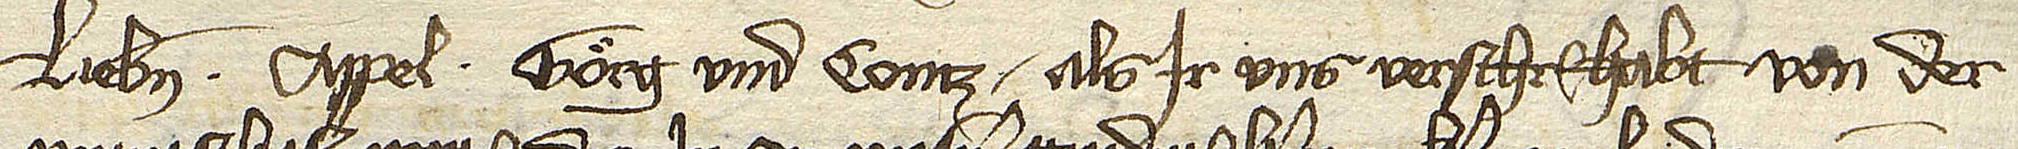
Liebn* . Appel . Görg vnd Concʒ / als Ir vns verſchr* habt von der
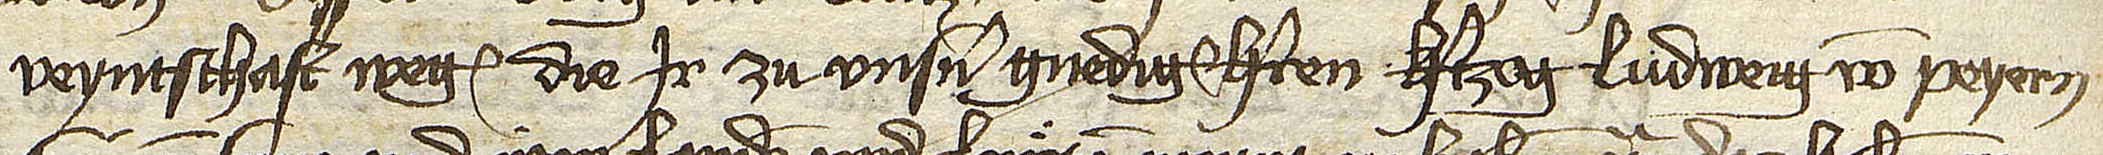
veyntſchaft weg* die Ir ʒu vnſn* gnedig* h*ren h*cʒog Ludweig vo* Peyern
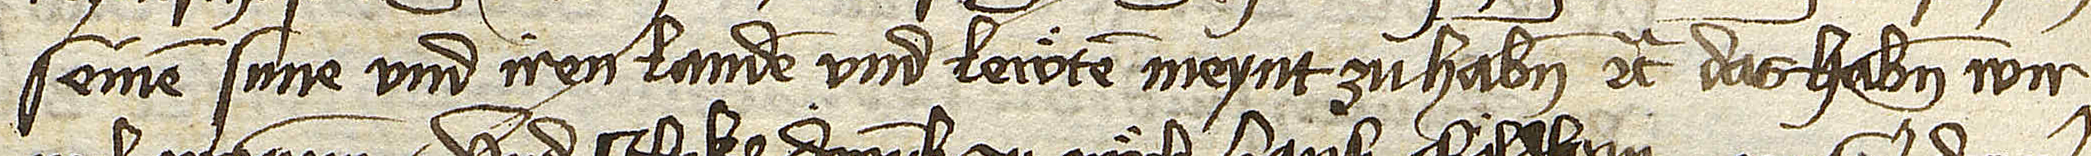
ſeine* ſune vnd iren lande* vnd leẅte* meynt ʒu habn* ec* das habn* wir
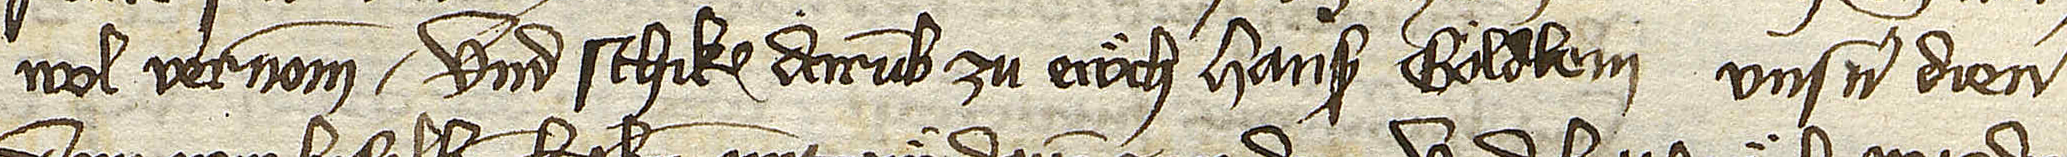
wol vernom* / Vnd ſchik* darub* ʒu eẅch Hanſ* Göldlein vnſn* dien*
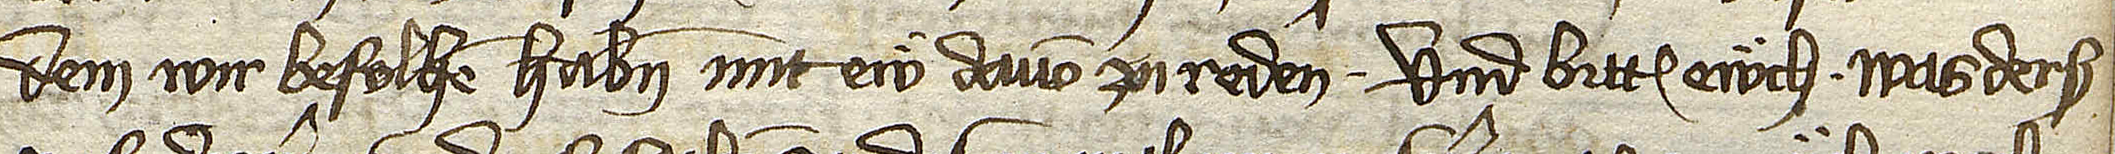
Dem wir befolhe* habn* mit eẅ dauo* ʒu reden . Vnd bitt* eẅch . was derſ*
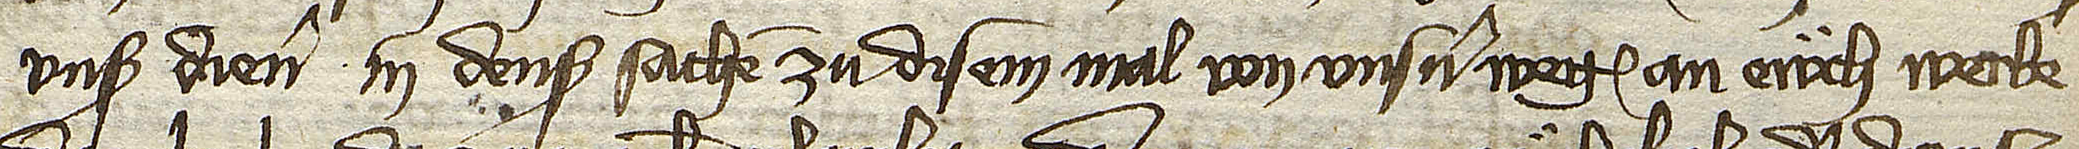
vnſ* dien* in denſ* ſache* ʒu diſem mal von vnſn* weg* an eẅch werbe
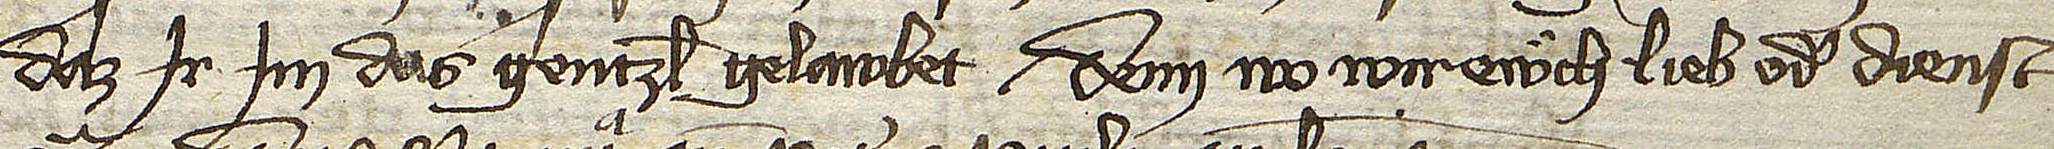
Daʒ Ir Im das gencʒl* gelawbet / Denn wo wir eẅch lieb od* dienſt
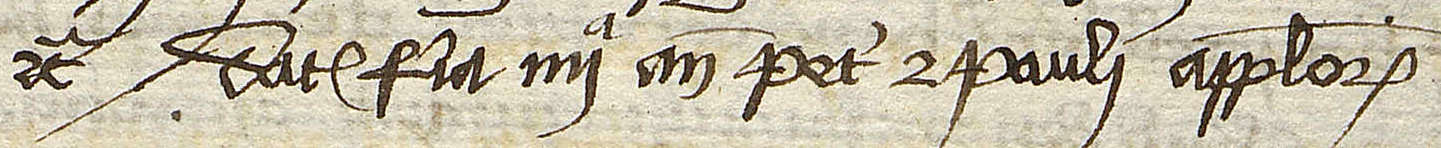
ec* / Dat* fi*a iiii* an* Pet* @ Pauli applo*
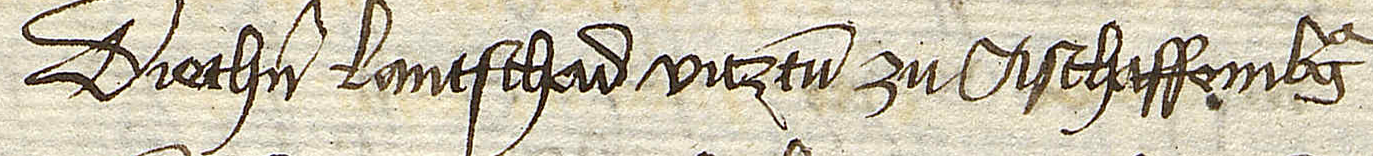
Diethn* Lantſchaid vicʒtu* ʒu Aſchaffemb*g
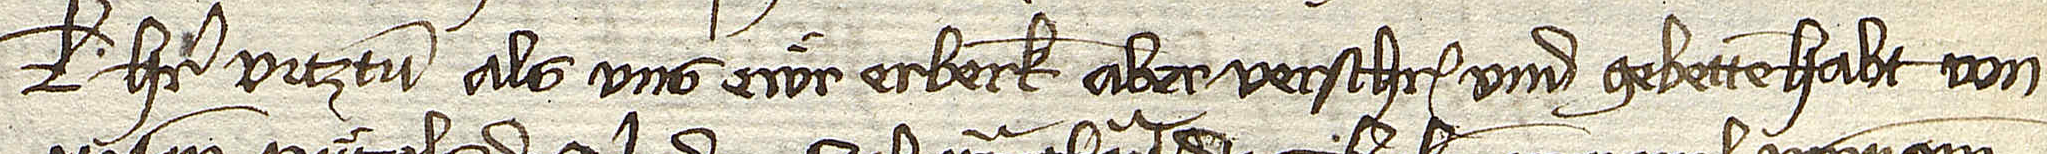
L* hr* vicʒtu* als vns eẅr erberk* aber verſchr* vnd gebette* habt von
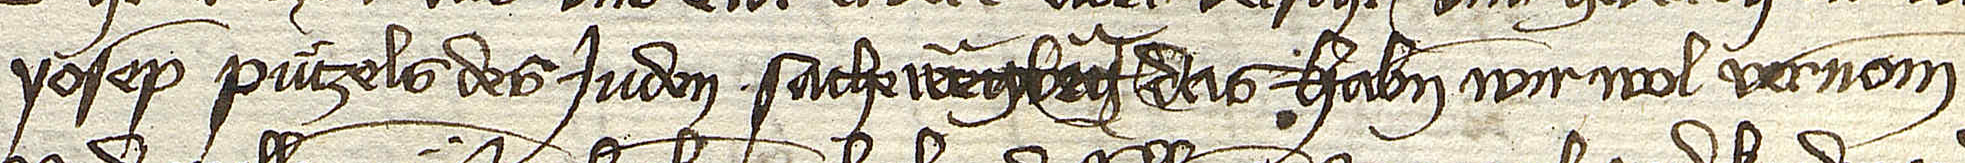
Yoſep Pücʒels des Iuden ſache weg* beg Das habn* wir wol vernom*
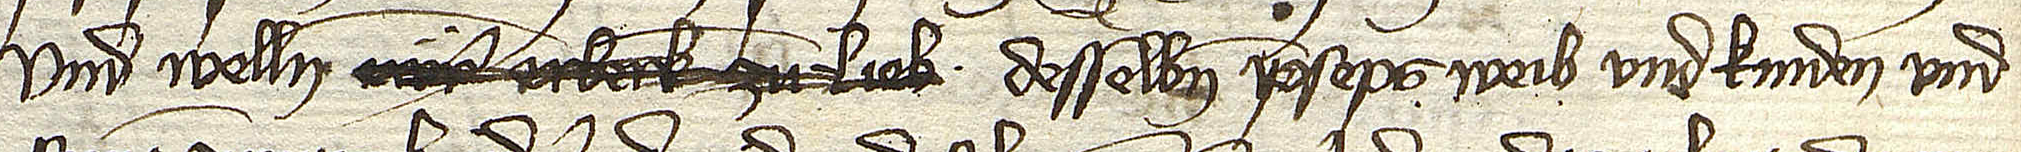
vnd welln* eẅr* erberk* ʒu lieb . deſſelbn* Yoſeps weib vnd kinden vnd
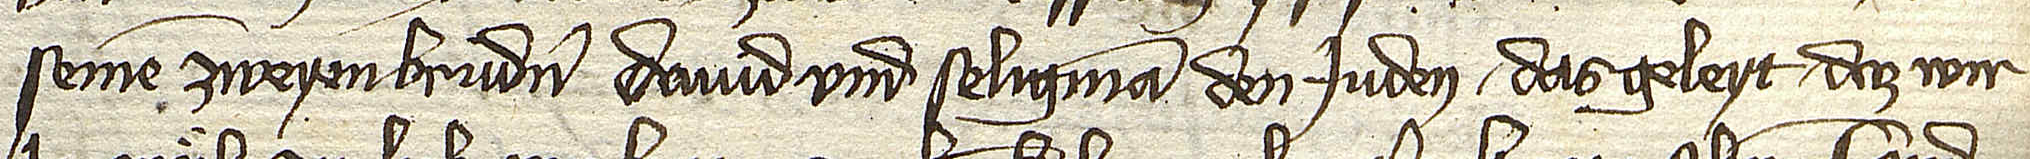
ſeine* ʒweyen brudn* Dauid vnd ſeligma* den Iuden / das geleyt / daʒ wir
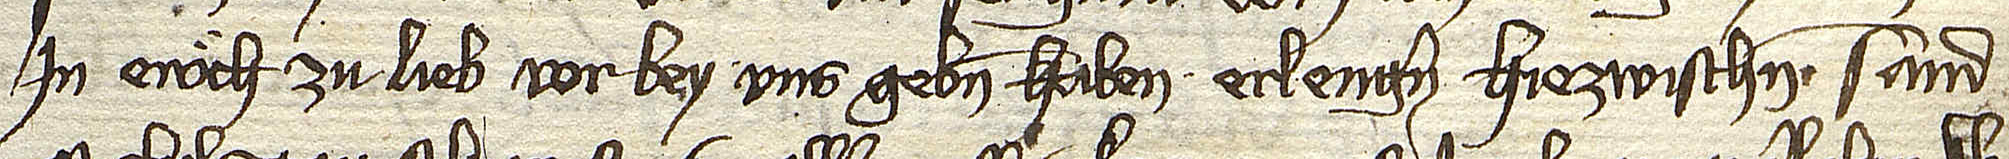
In eẅch ʒu lieb vor bey vns gebn* haben . erleng*n hieʒwiſchn* . ſand
